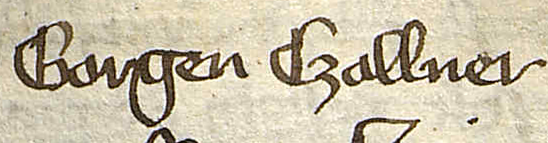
Gorgen Cʒollner
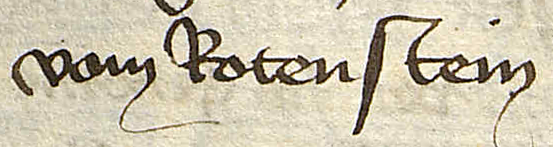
vom Rotenſtein
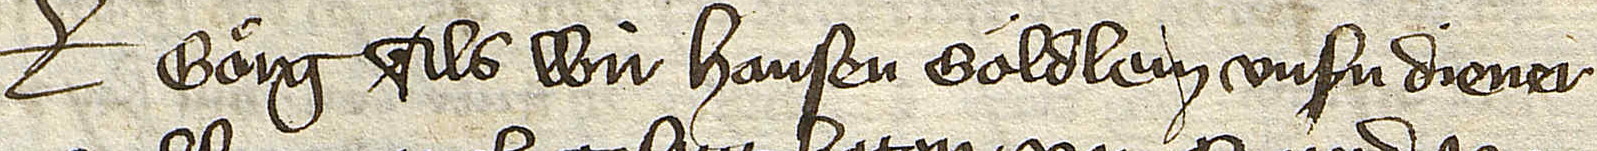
L* Görg Als wir hanſen Göldlein vnſ*n diener
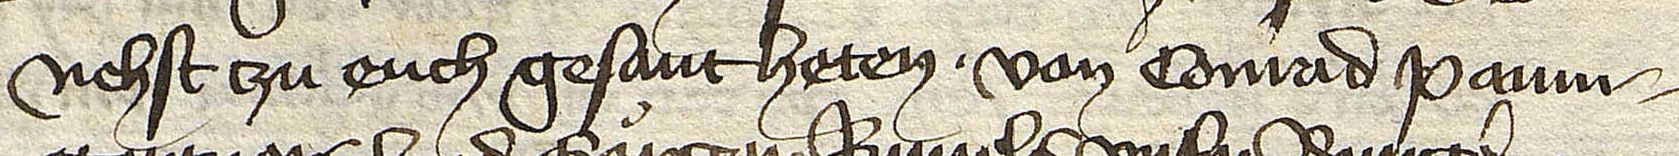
nehſt cʒu euch geſant heten / von Conrad Paum =
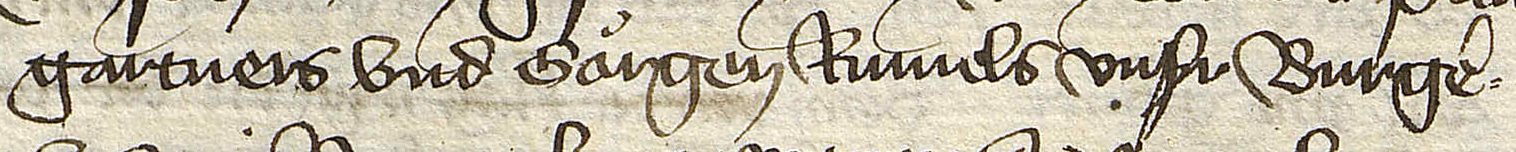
gartners vnd Görgen Rumels vnſ*r Burge*
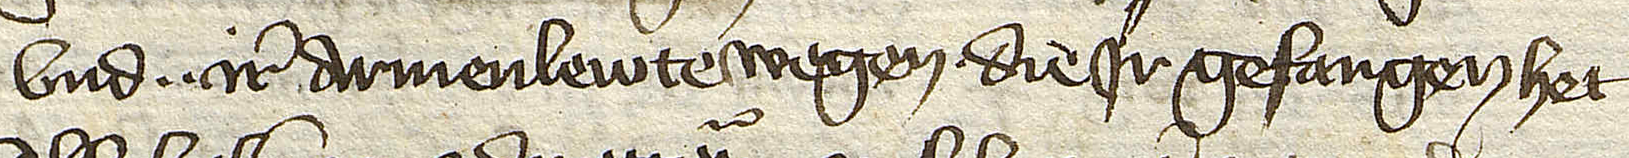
vnd ~ ir* Armenlewte wegen . die Ir gefangen het
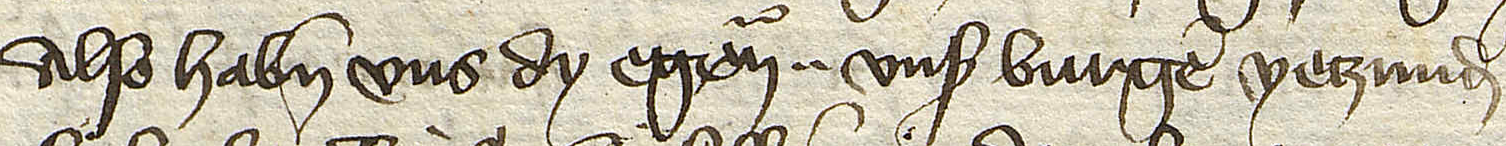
Alſo habn* vns dy egen* ~ vnſ* burge* yecʒund*
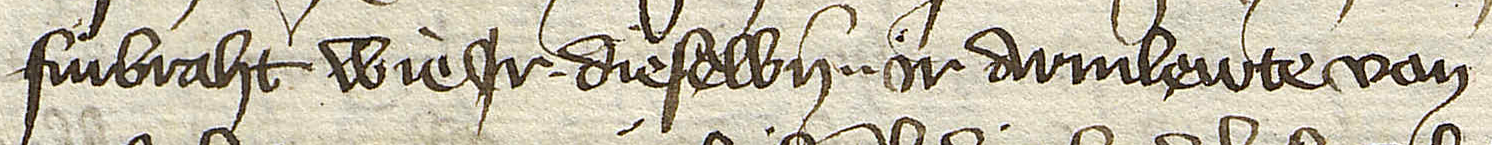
fürbraht wie Ir . dieſelbn* ~ ir Armlewte von
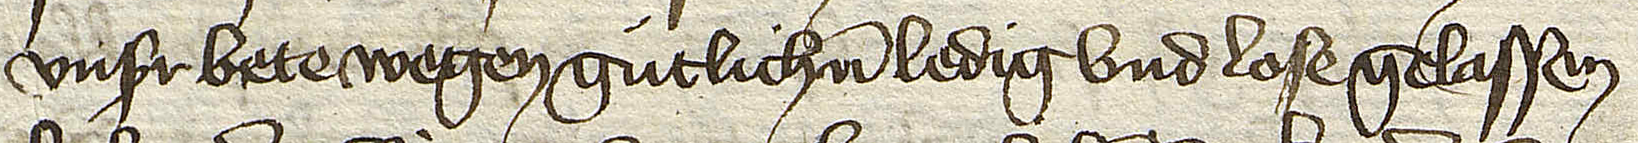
vnſ*r bete wegen gütlichn* ledig vnd loſe gelaſſen
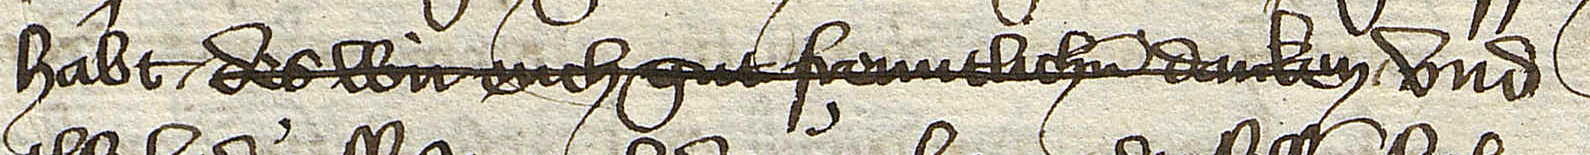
habt / des wir euch gut freutlichn* danken / vnd
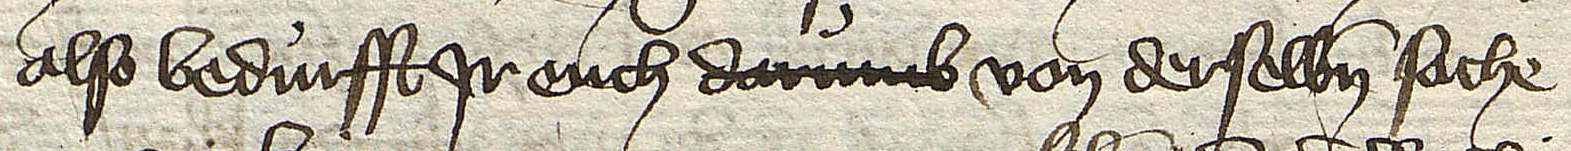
alſo bedürfft Ir euch darümb von derſelbn* ſache
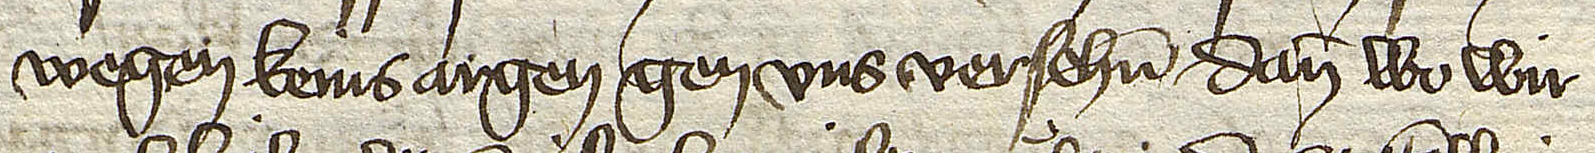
wegen keins argen gen vns verſehn* / dan* wo wir
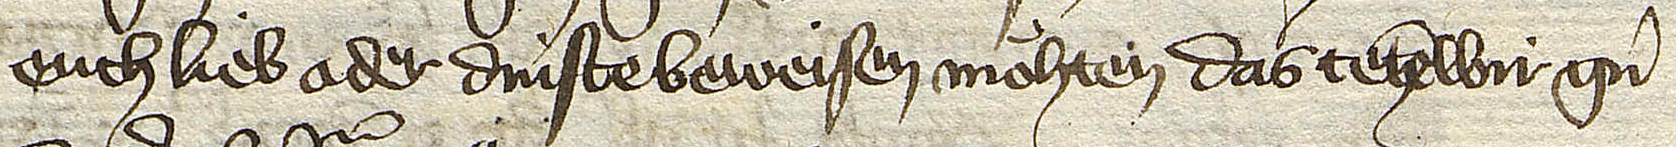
euch lieb oder dinſte beweiſen möhten das tete* wir gn*
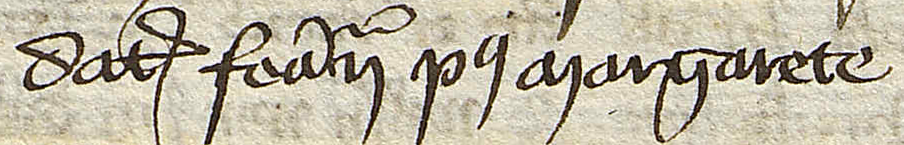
Dat* fea* ii* p* Margarete
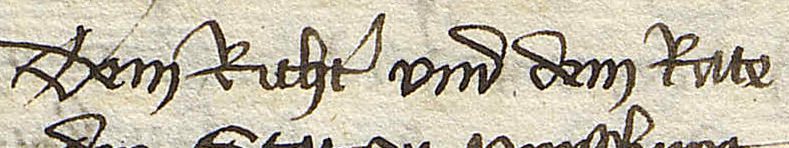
Dem Richt* vnd dem Rate
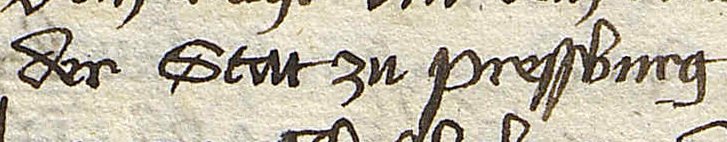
der Stat ʒu Preſſburg
